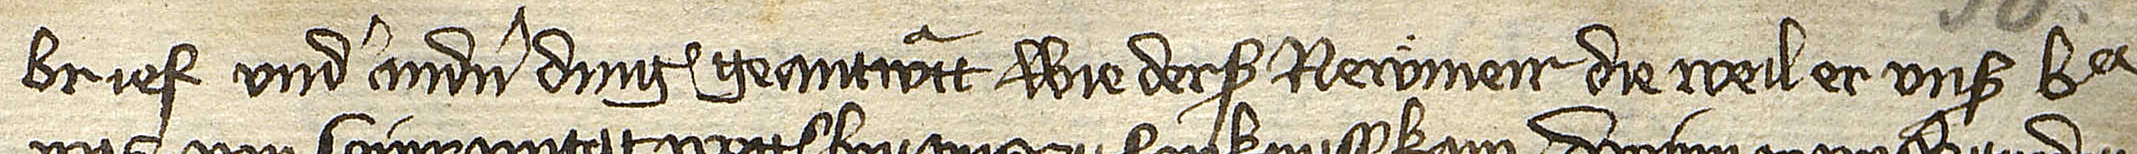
brief vnd* andn* ding* geantw*tt / wie derſ* Neẅmeir die weil er vnſ* b*
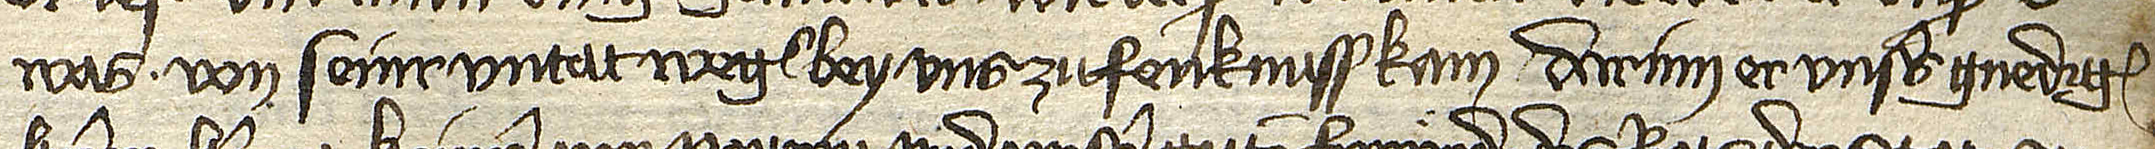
was . von ſeinr vntat weg* bey vns ʒu fenknuſſ kam / Darinn er vnſ*s gnedig*
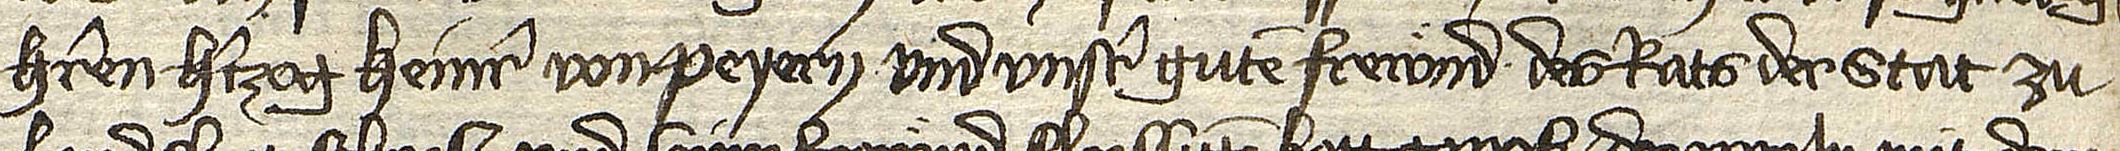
h*ren h*cʒog heinr* von Peyern vnd vnſr* gute* freẅnd* . des Rats der Stat ʒu
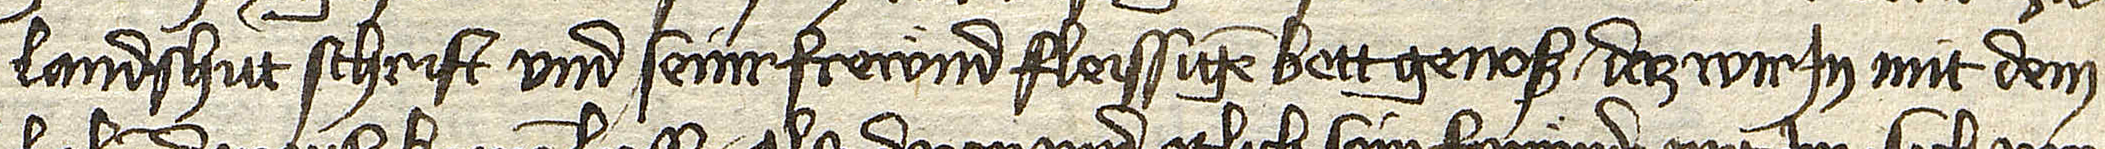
landſhut ſchrift vnd ſeinr freẅnd fleiſſige* bett genoſʒ / daʒ wir In mit dem
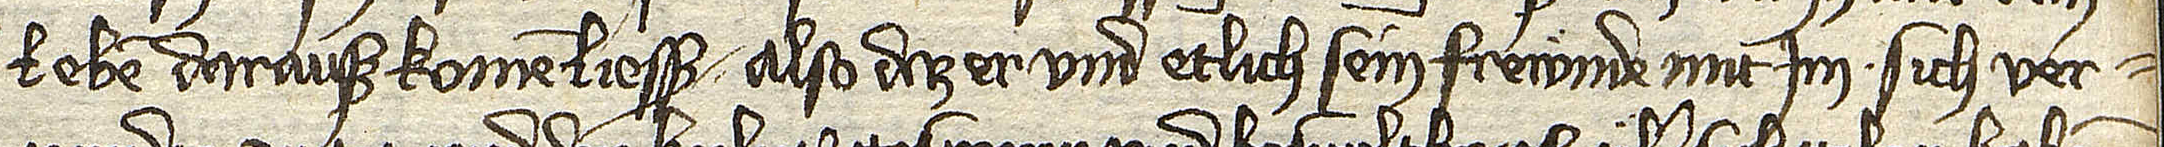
lebe* darauſʒ kome* lieſſ* / alſo daʒ er vns etlich ſein freẅnde mit Im . ſich ver =
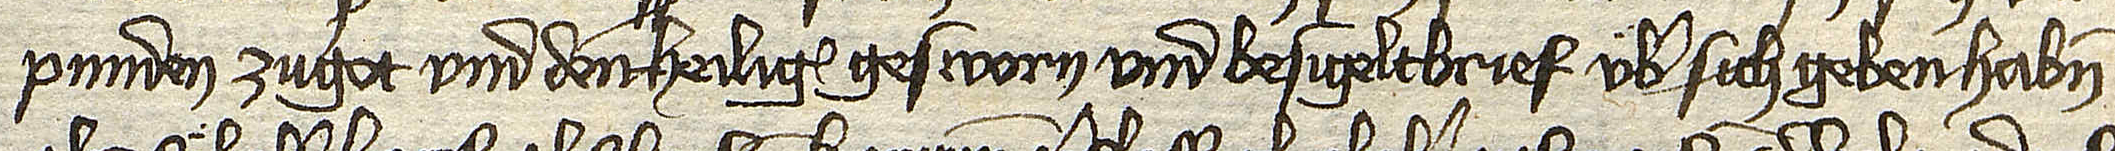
punden ʒugot vnd den heilig* geſworn vns beſigelt brief v̈b* ſich geben habn*
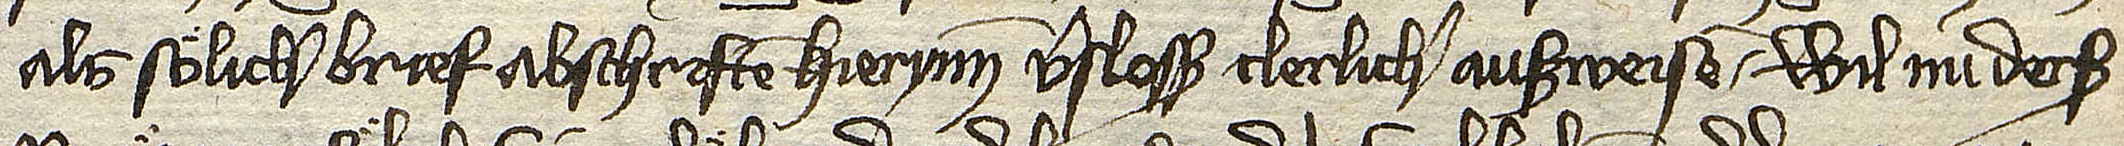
als ſölich* brief abſchrifte* hierynn* v*ſloſſ* clerlich* auſʒweiſe* / wil nu derſ*
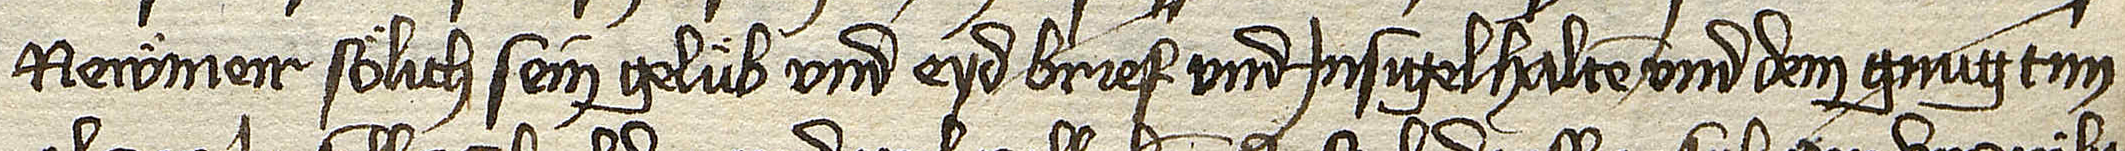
Neẅmeir ſölich ſein gelüb vnd eyd brief vnd Inſigel halte* vnd dem gnug tun
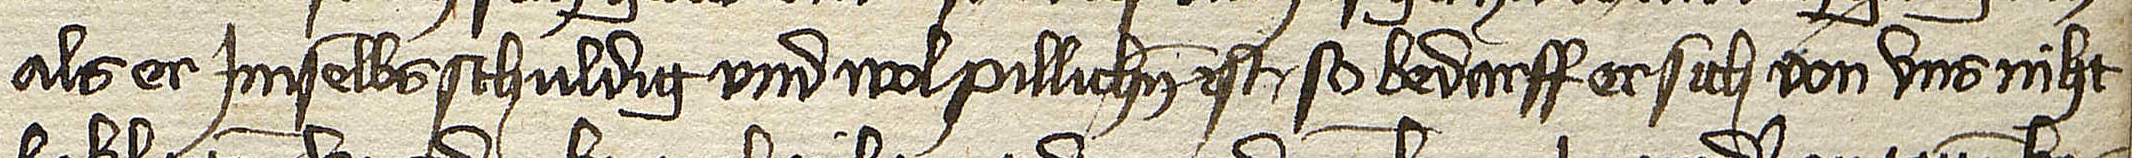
als er Imſelbs ſchuldig vnd wol pillichn* iſt / ſo bedarff er ſich von vns niht
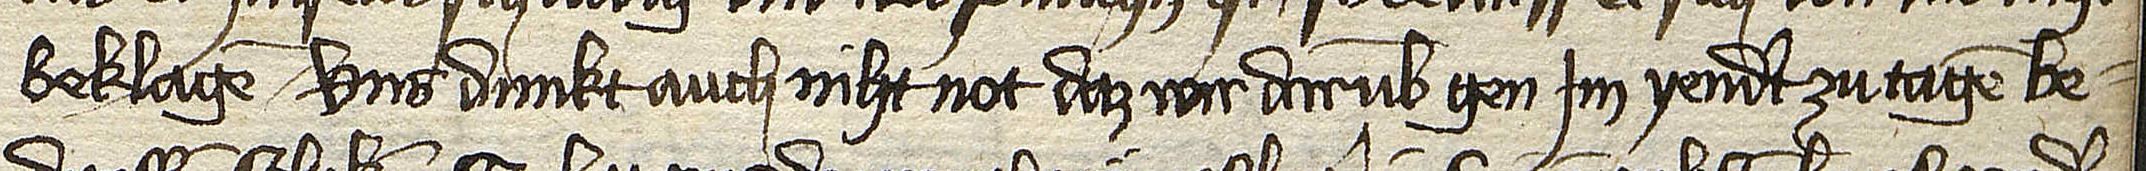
beklage* / Vns dunkt auch niht not daʒ wir darub* gen Im yend*t ʒu tage* be =
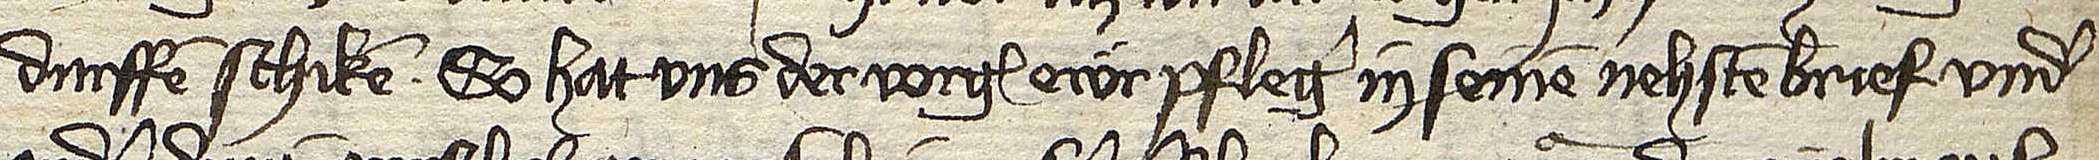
durffe* ſchike* . So hat vns der vorg* eẅr pfleg* in ſeine* nehſte* brief vnd*
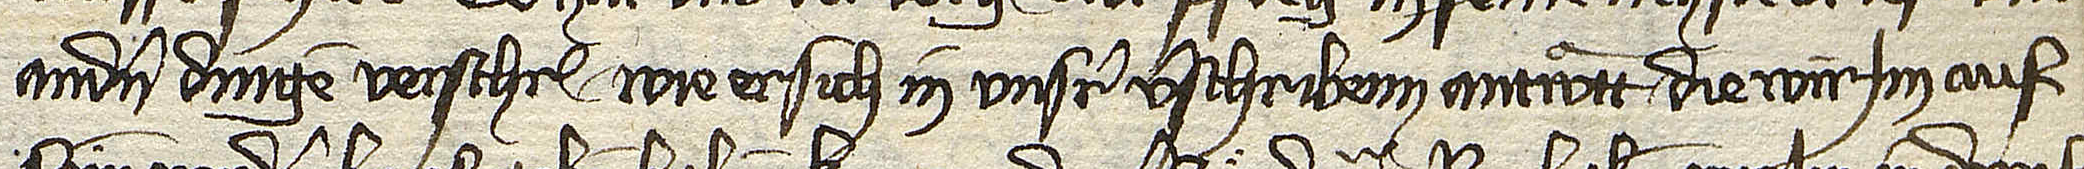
andn* dinge* verſchr* / wie er ſich in vnſr* v*ſchribenn antw*tt / die wir Im auf
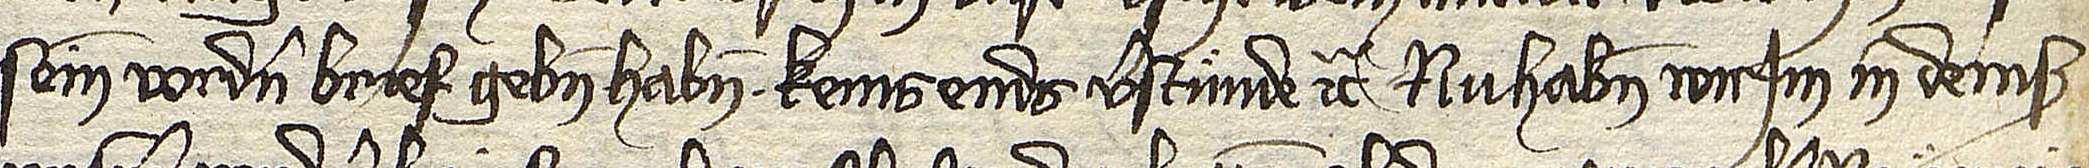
ſein* vordn* brief gebn* habn* . keins ends v*ſtünde ec* / Nu habn* wir Im in demſ*
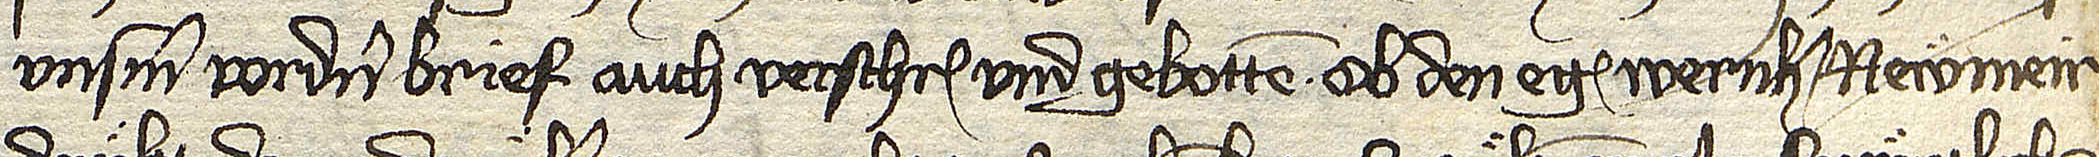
vnſm* vordn* brief auch verſchr* vnd gebotte* . Ob den eg* wernh* Neẅmeir
